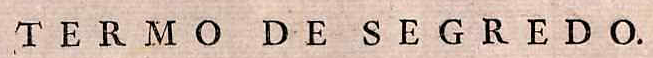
TERMO DE SEGREDO.
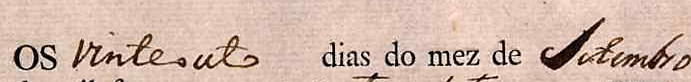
OS vinte outo dias do mez de Setembro
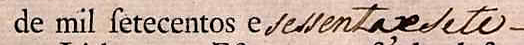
de mil setecentos e sessenta e sete
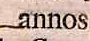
annos
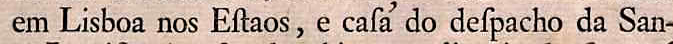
em Lisboa nos Estaos, e casa do despacho da San
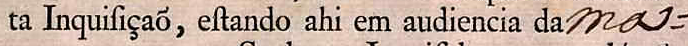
ta Inquisiçaõ, estando ahi em audiencia da ma
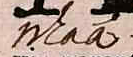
nhaã
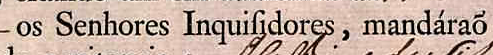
os Senhores Inquisidores, mandáraõ
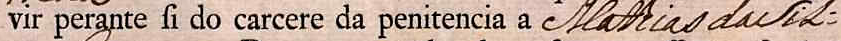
vir perante si do carcere da penitencia a Matias da Sil
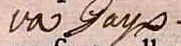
va Gayo
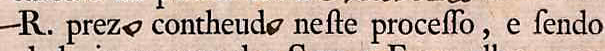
R. prezo contheudo neste processo, e sendo
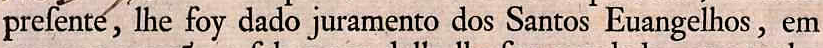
presente, lhe foy dado juramento dos Santos Euangelhos, em
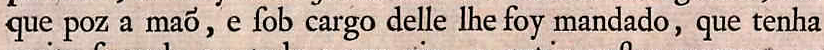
que poz a maõ, e sob cargo delle lhe foy mandado, que tenha
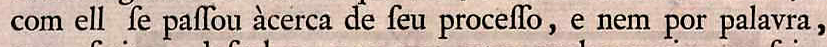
com ell se passou ácerca de seu processo, e nem por palavra,
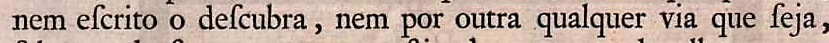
nem escrito o descubra, nem por outra qualquer via que seja,
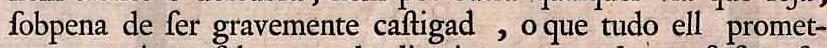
sob pena de ser gravemente castigad, o que tudo ell promet
